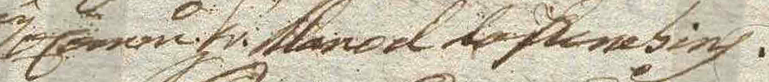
O Comm.o fr. Manoel dos Qerubins.
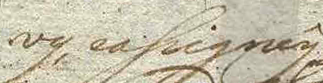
vy, e assigneŷ
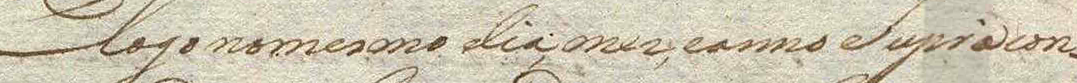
E logo no mesmo dia, mes, e anno Supra con
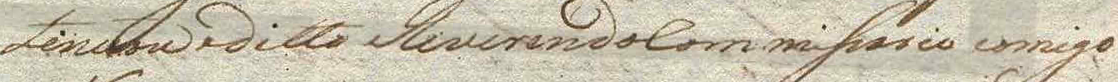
tinuou o ditto Reverendo Commissario comigo
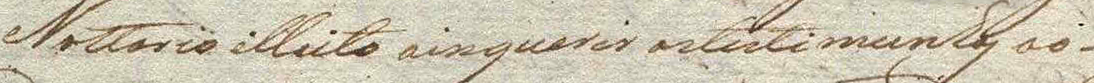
Nottario illeito a inquerir as testimunhas ao
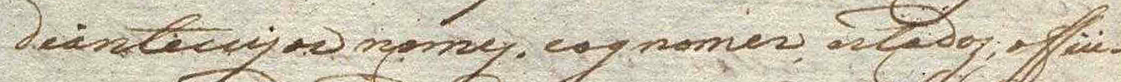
diante cujos nomes, cognomes, estados, offici
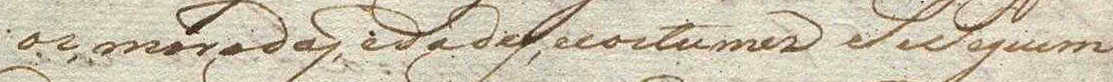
os, moradas, idades, e costumes se seguem
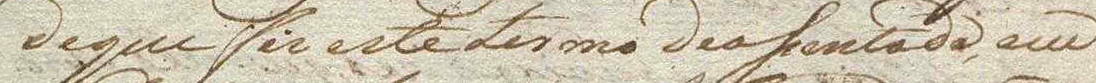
de que fis este termo de assentada, e eu
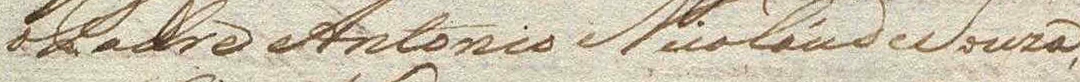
o Padre Antonio Nicoláu de Souza,
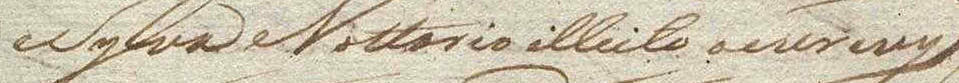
e Sylva Nottario illeito o escrevy
